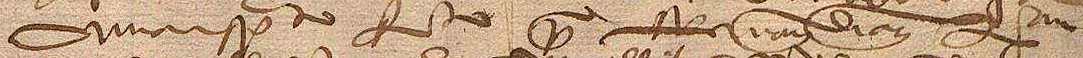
Cima sp̄to fto p̄o ffernão diaz tbam
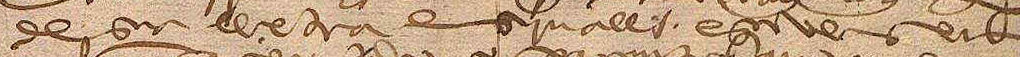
de sua lletra e synall /. e serve seu
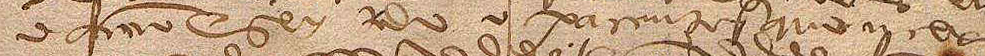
oficio e sey todo parentesquo nella
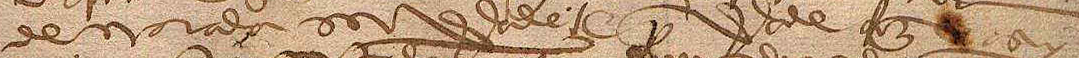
decrarada ser ꝟdade / e p̄o ꝟdade fiz e asy
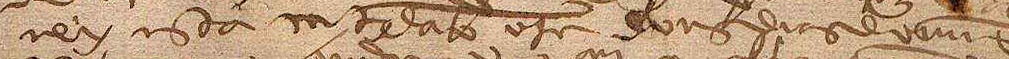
ney esta certydão oJe dous dias do mes
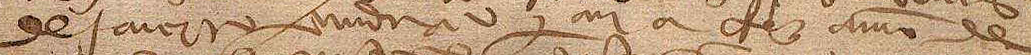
de Janejro Amdre ao tam a fez an̄o de
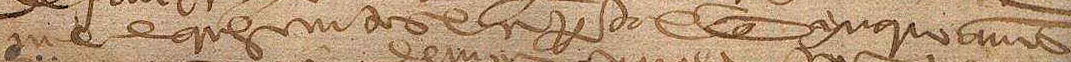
mil e quinhemtos e coRēta e Cynquo anos
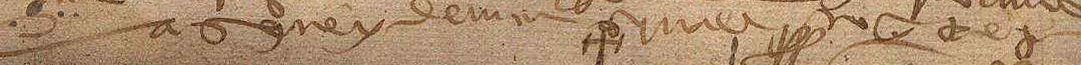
e asyney de meu synall ꝓpco q̄ tal he
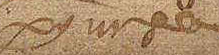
p̄g nihill
